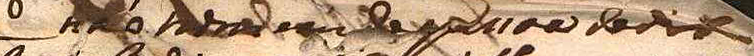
E naõ nomeando a pessoa do dito
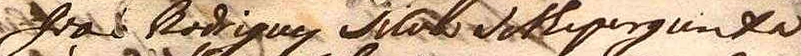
Joaõ Rodrigues Silva se lhe pergunta
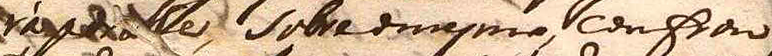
rá por elle, sobre o mesmo, confron
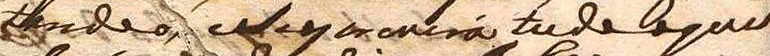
tandoo, e se escreuerá tudo o que
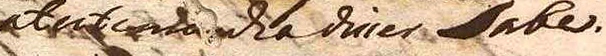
a testem_nha disser Sabe.
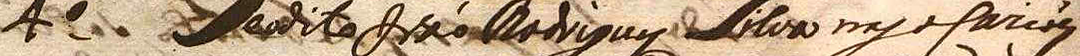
4o. Se o dito Joaõ Rodrigues Silva nas oCaziões
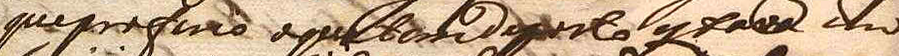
que proferio o que tem deposto estava em
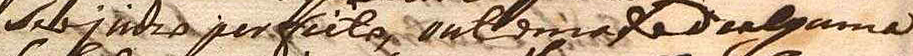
seo juizo perfeito, ou tomado de alguma
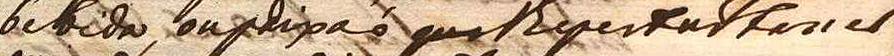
bebida, ou paixaõ que lhe perturbasse
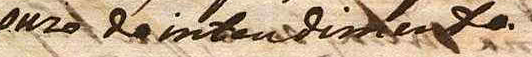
o uzo de intendimento.
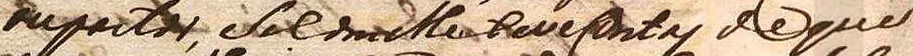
ou pastor, Se com elle teue Contas de que
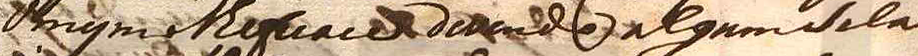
o mesmo lhe ficace devendo algum sela
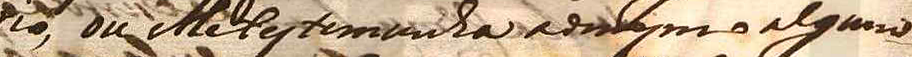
rio, ou elle testemunha ao mesmo algum
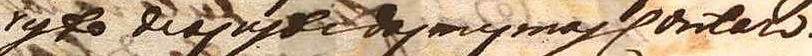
resto de ajuste das mesmas Contas.
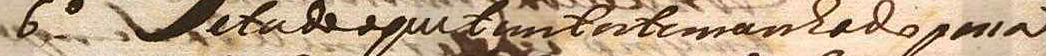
6.o Se tudo o que tem testemunhado passa
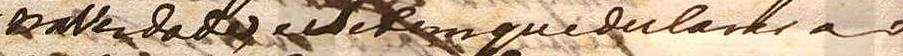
na verdade, e se tem que declarar ao
